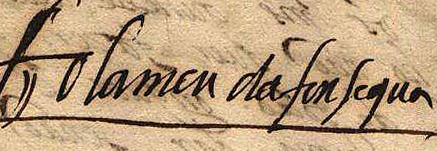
b̄olameu da fonsequa
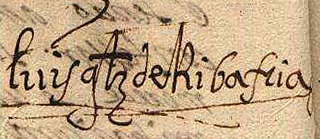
luis gl̄z de Ribafria
